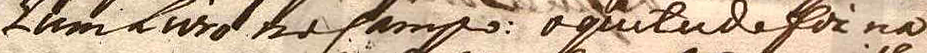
hum Livro no Campo: o que tudo foi na
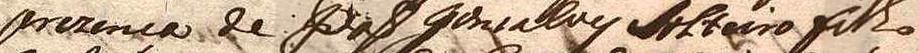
prezença de Joaõ Goncalves Solteiro filho
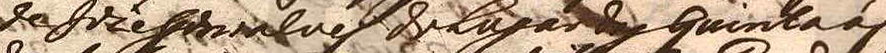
de Jozé Gonsalves do Lugar das Quintaãs
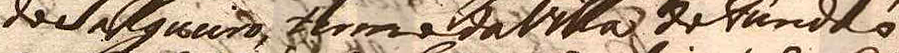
do Salgueiro, termo da Villa do Fundaõ
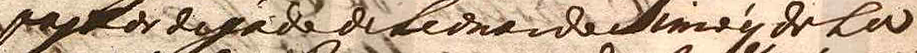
pastor de gado de Leonardo Simoẽs do Lu
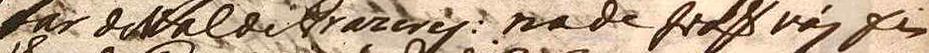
gar de Val de Prazeres: na de Joaõ vás fi
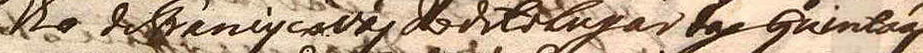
lho de Francisco vás do dito Lugar das Quintaãs
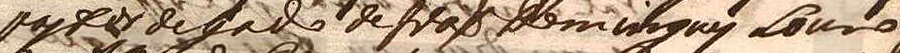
pastor de gado de Joaõ Domingues Louro
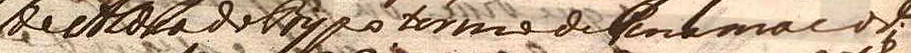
de Aldea do Bispo termo de Penamacor.
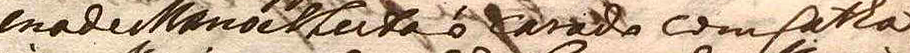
e na de Manoel Leitaõ casado com Catha
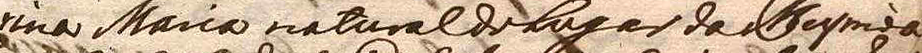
rina Maria natural do Lugar da Meymoa
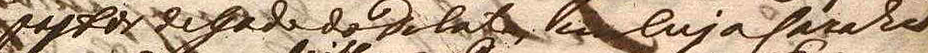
pastor de Gado do Delato, em cuja Caza he
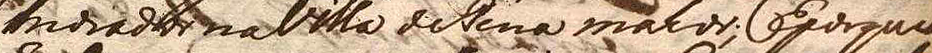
morador na Villa de Penamacor; E porque
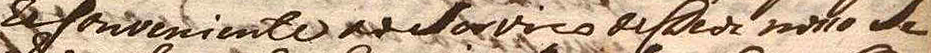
he Conveniente ao Serviço de Deos nosso Se
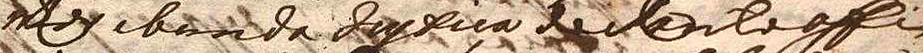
nhor e bem da Iustiça de Santo offi
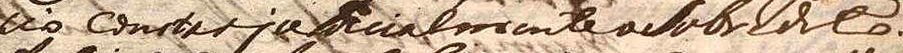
cio constar judicialmente o Sobredito
